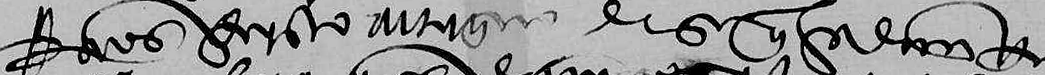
item aos seysto artyguo dise q̄ ha dita Re
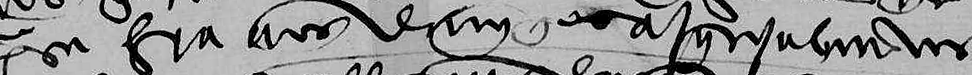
p̄sa hya aos domȳgos a Jgreja bem ves
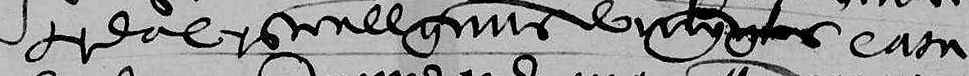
tyda e ysto allguūs domȳgos e ata
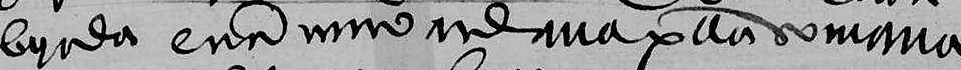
byada e nā como andaua p̄lla somana
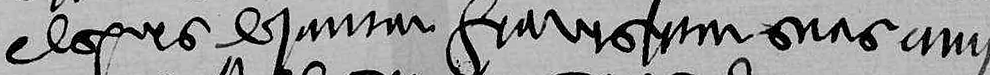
e despoys do jantar hya vysytar suas amj
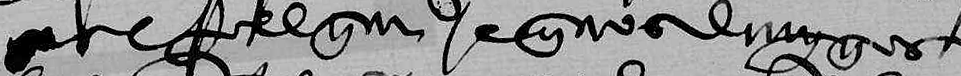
gas e follgar / e q̄ aos domȳgos
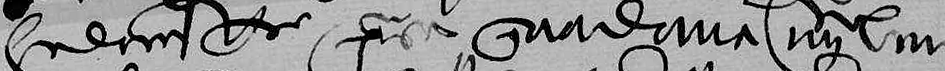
ha dita Ree p̄sa guardaua mto bem
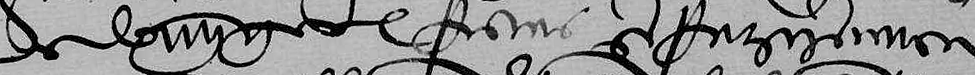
os domȳgos e festas sē fazerē cousa
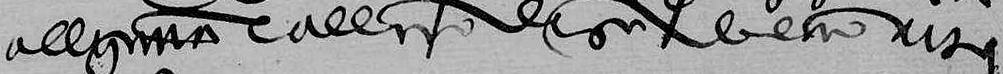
allguūa e all n̄o dise do dito arty
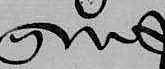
guo
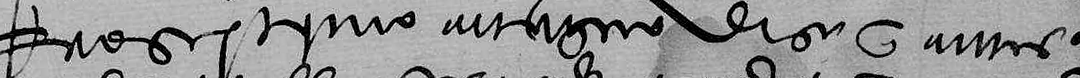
item ao septymo artyguo dise q̄ antes
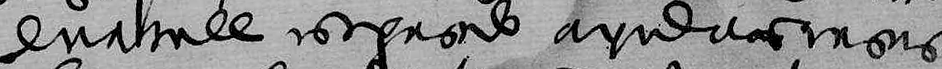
do natall este pasado aynda as casas
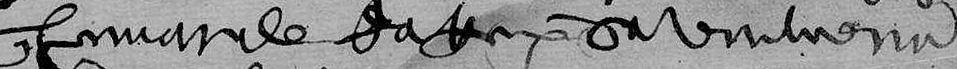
q̄ ho marydo da Re p̄sa vendera nā
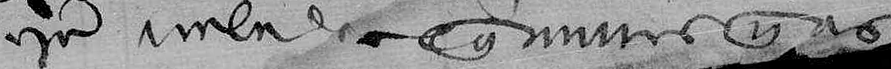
erā acabadas e q̄ amtes q̄ as
